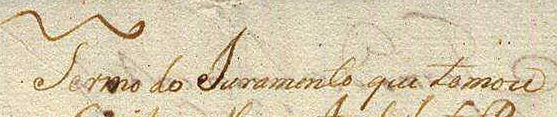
Termo do Iuramento que tomou
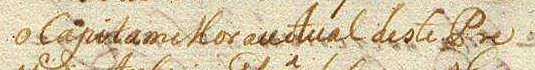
o Capitam Mor auctual deste Pre
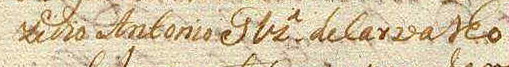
zidio Antonio Glz̄ de Carvalho
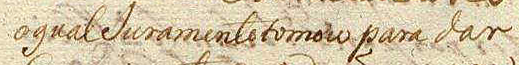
o qual Iuramento tomou para dar
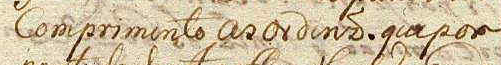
Comprimento as ordenz̄. que por
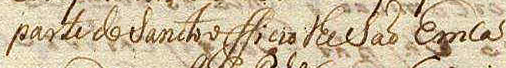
parte do Sancto officio lhe Saõ Emca
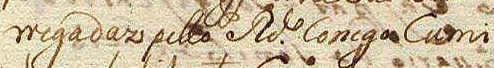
rregadaz pello Rd.o Conego Cumi
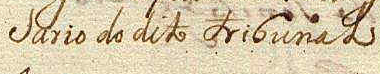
Sario do dito TribunaL
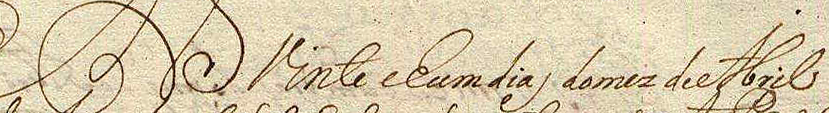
AOS Vinte e hum dias do mez de Abril
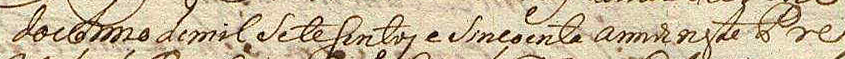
do Anno de mil setesentos e sincoenta annoz neste Pre
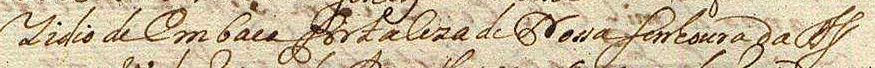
Zidio de Embaca fortaleza de Nossa Senhoura da As
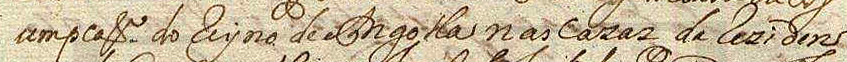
umpçaõ do Reyno de Angolla nas cazaz da Reziden
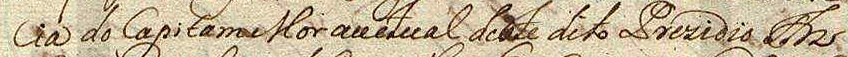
cia do Capitam Mor auctual deste dito Prezidio An
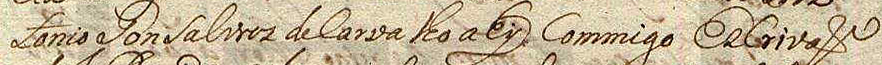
tonio Gonsalvrez de Carvalho ahy Commigo EsCrivaõ
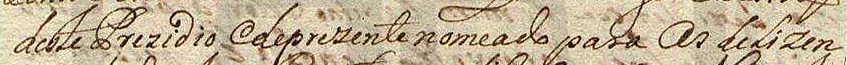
deste Prezidio e de prezente nomeado para As delizen
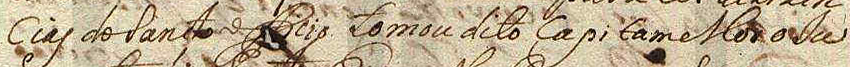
Cias do Sancto officio tomou dito Capitam Mor o Iu
